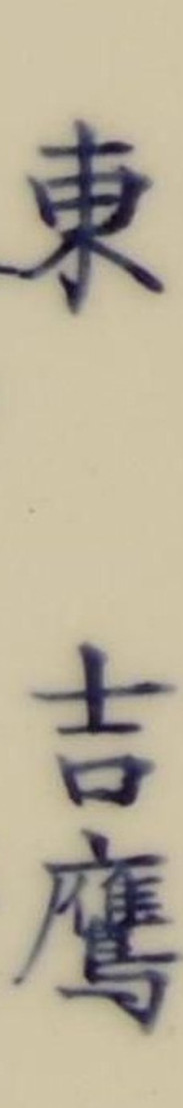東吉鷹
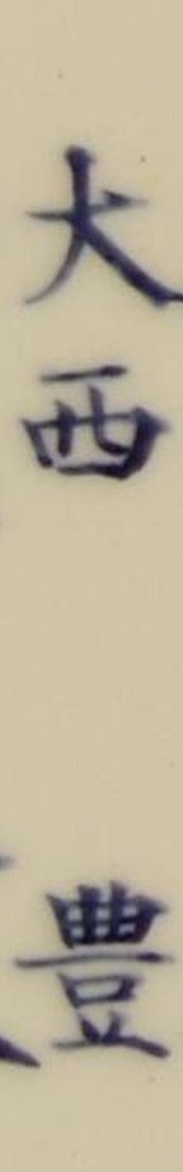大西豊
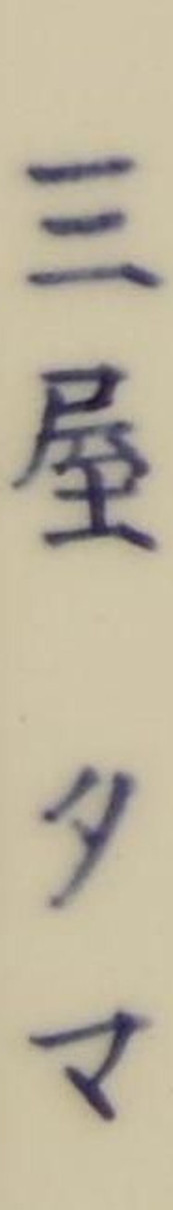三屋タマ

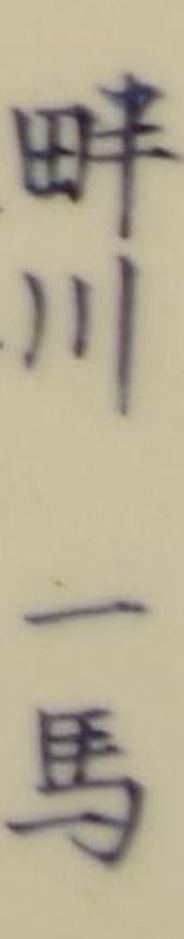畔川一馬
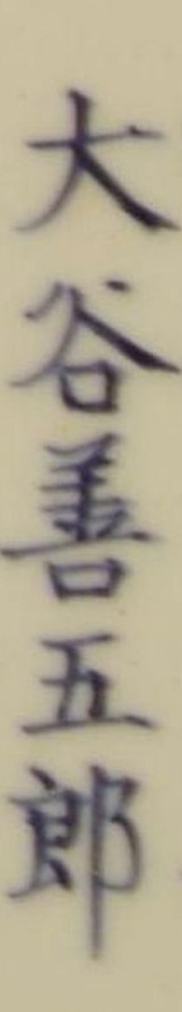大谷善五郎
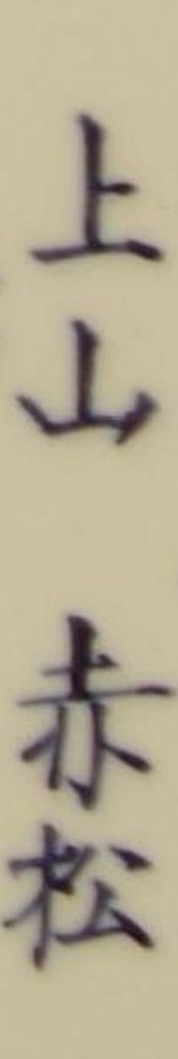上山赤松
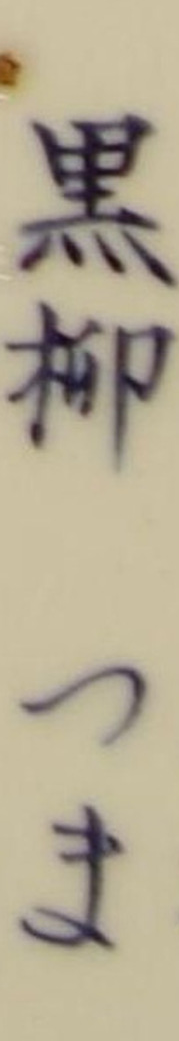黒柳つま
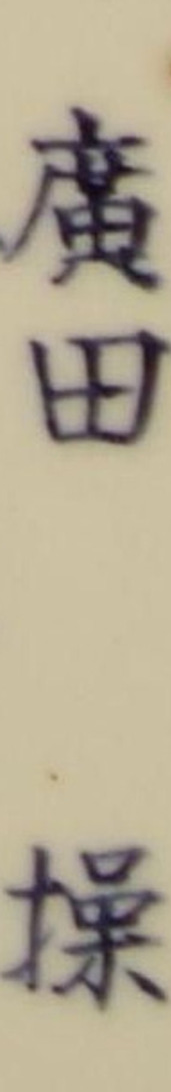廣田操
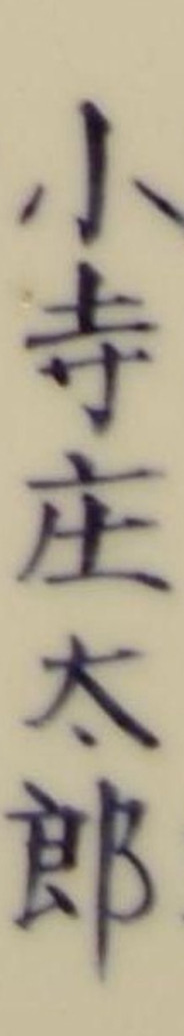小寺庄太郎
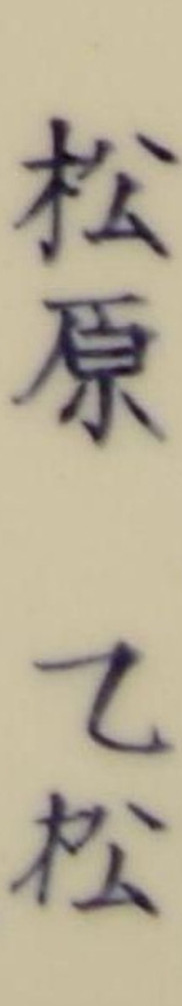松原乙松
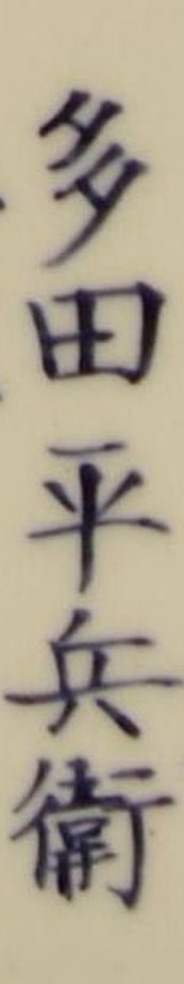多田平兵衛
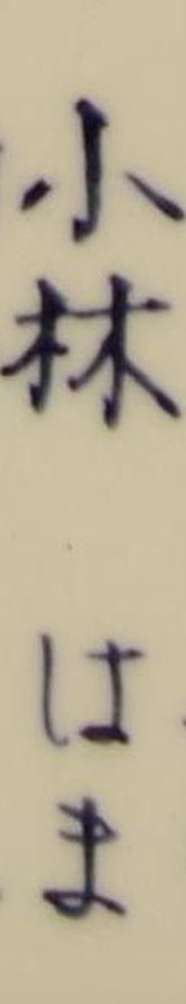小林はま
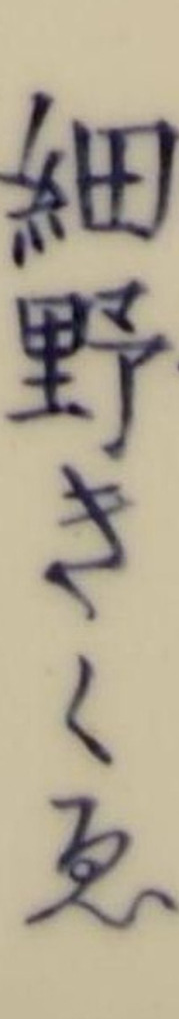細野きくゑ
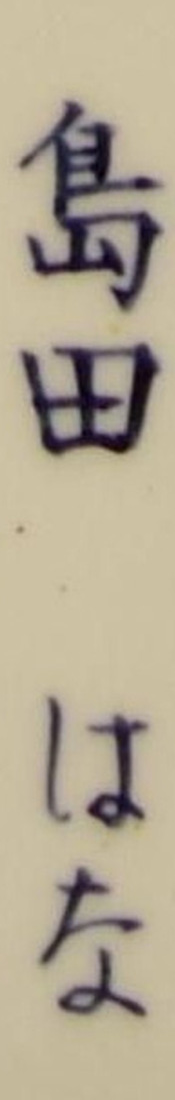島田はな
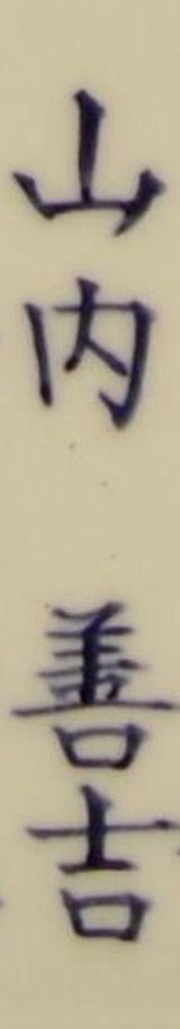山内善吉
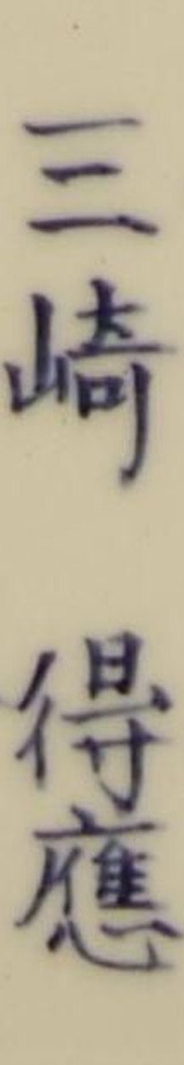三崎得應
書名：E~L
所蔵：高野山金剛峯寺
